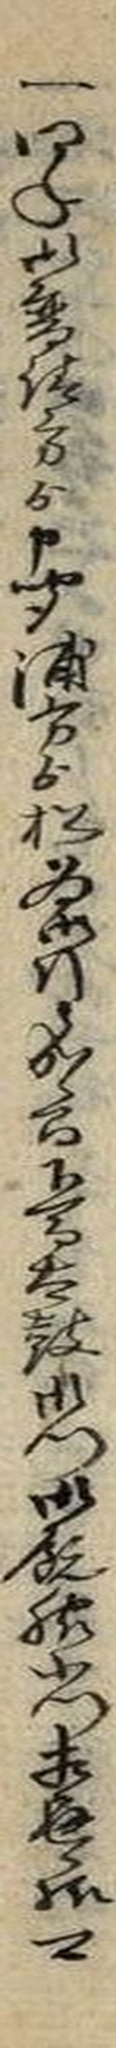一同年御普請方ゟ申聞浦方ゟ松為御引被成候間下馬太鼓御門御厩脇小門相通候様可
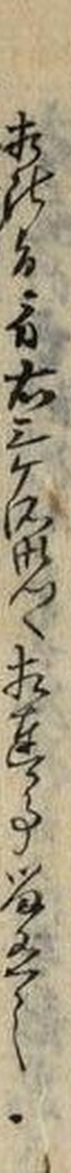相断旨に付右三ヶ所御門へ相達候事留有之
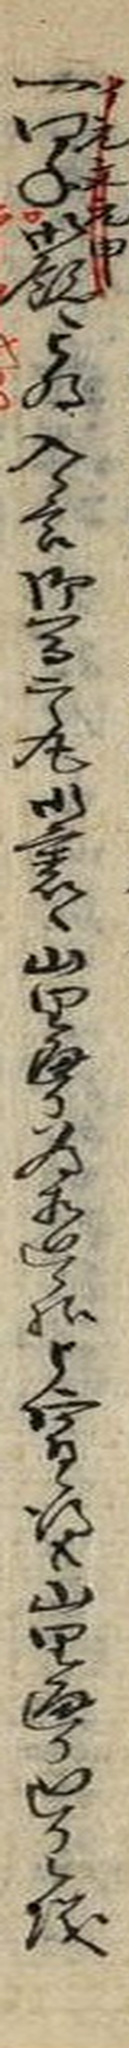一同年○六月五日此間御厩へ被為入候節御馬二之丸御裏へ山里通り為相廻候様被仰付候得共山里通り廻り候儀
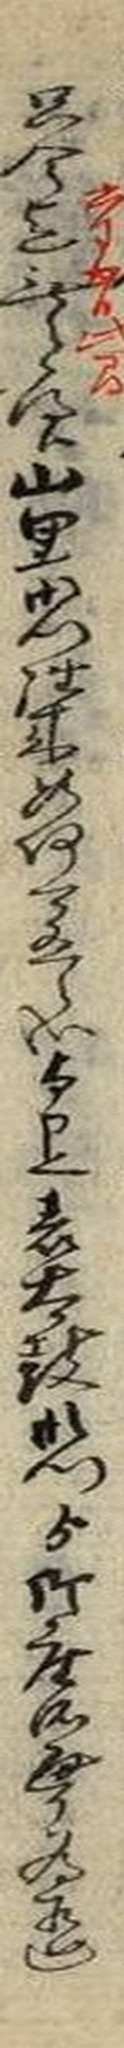只今迄無之候得共山里御門往来如何可有之哉と申上表太鼓御門ゟ御座所通り為相廻
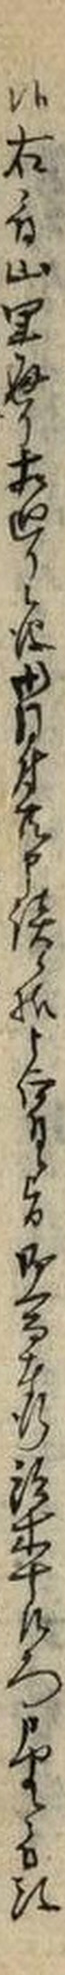候右に付山里通り相廻り候儀御目付共申談候様被仰付候旨御馬奉行鈴木平左衛門申聞候に付致
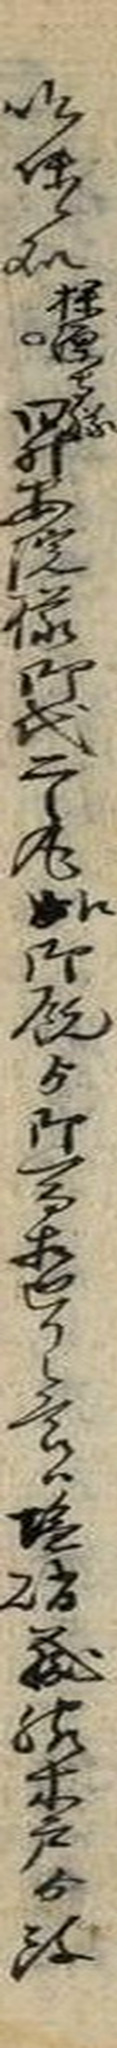吟味候処○探源寺様昇安院様御代二之丸江御厩ゟ御馬相廻り候節は塩硝蔵脇木戸ゟ致
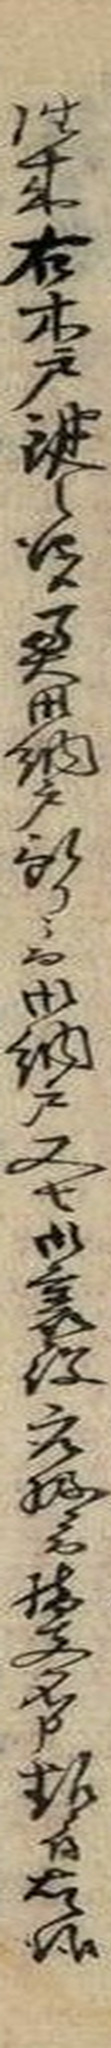往来右木戸鍵之儀は奥御納戸預りに而御納戸又は御裏役取扱に而指支不申趣に付右趣
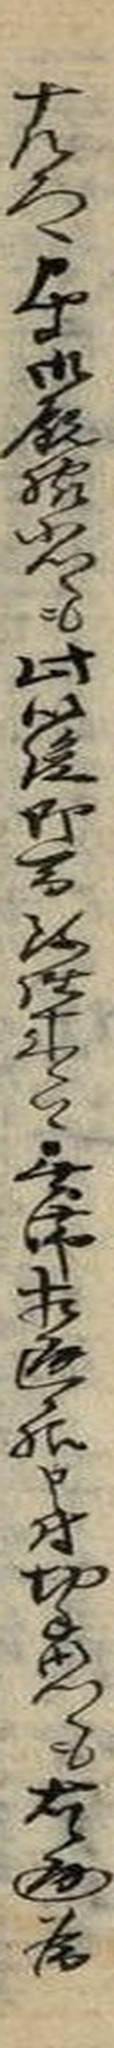十左衛門へ申聞御厩脇小門へも此以後御馬致往来候はゝ無滞相通候様申付切手御門へも右之通為
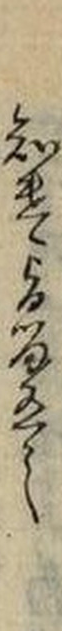知遣候旨留有之
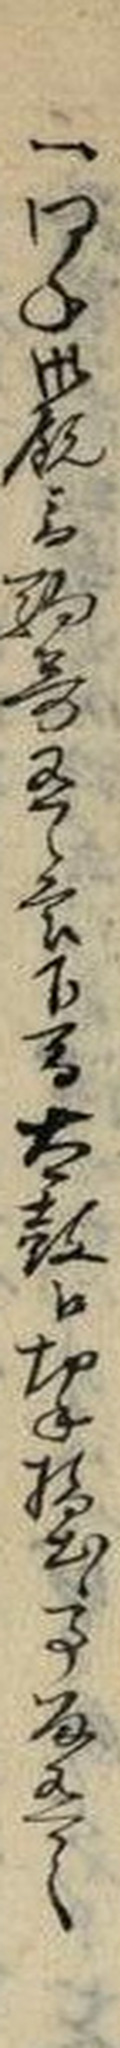一同年御厩に而駒寄有之候節下馬太鼓江切手指出候事留有之
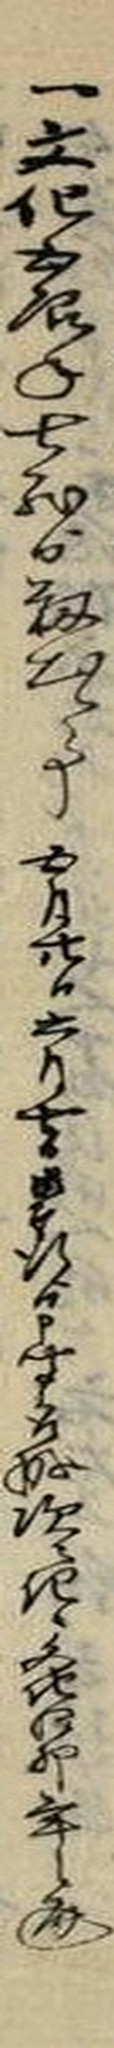一文化五辰年七蔵ゟ籾出候事五月廿日六月七日御奉行ゟ申聞取扱次に記候文化四卯年之通
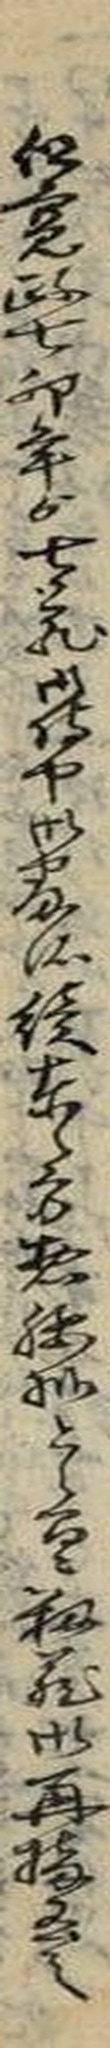但寛政七卯年ゟ七ツ蔵御侍中御番所続東之方惣腰掛との間に籾蔵御再構有之
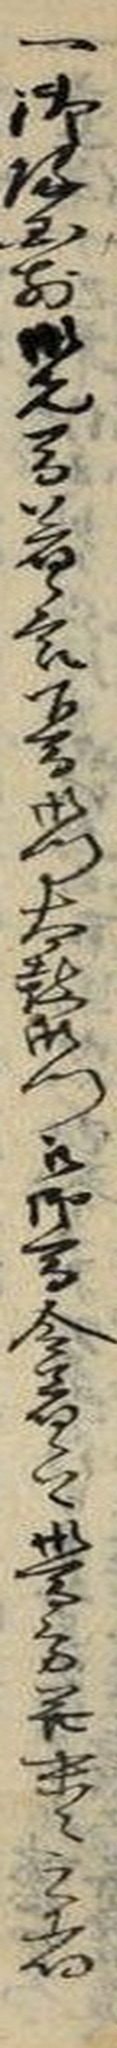一御帰国前御先馬着候節下馬御門太鼓御門江御馬令着候はゝ御馬方并末々之者
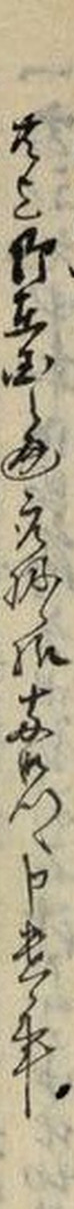共迄御在国之通取扱候様両御門へ申遣候事
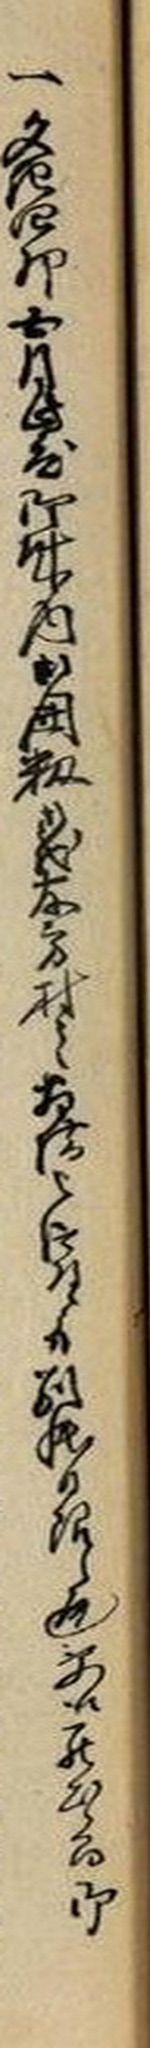一文化四卯五月此度御城内御囲籾御代官方村々拝借被仰付候に付別紙日限之通受取罷出候間御
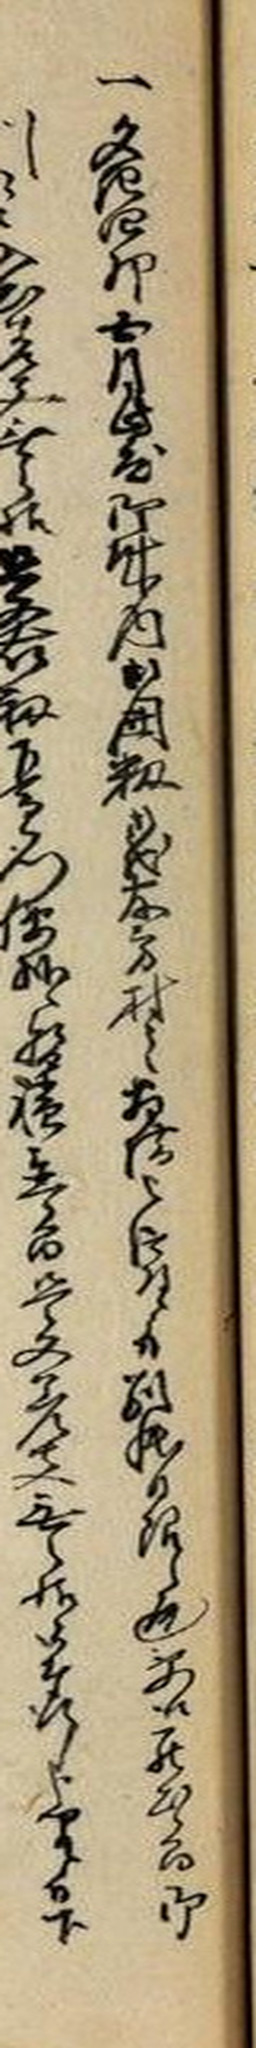門々々入出差支無之候様且又右籾下馬御門腰掛へ暫積置候間是又差支無之様御奉行被申聞候に付下
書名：御門御櫓之部
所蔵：福井県文書館 Fukui Prefectural Archives
